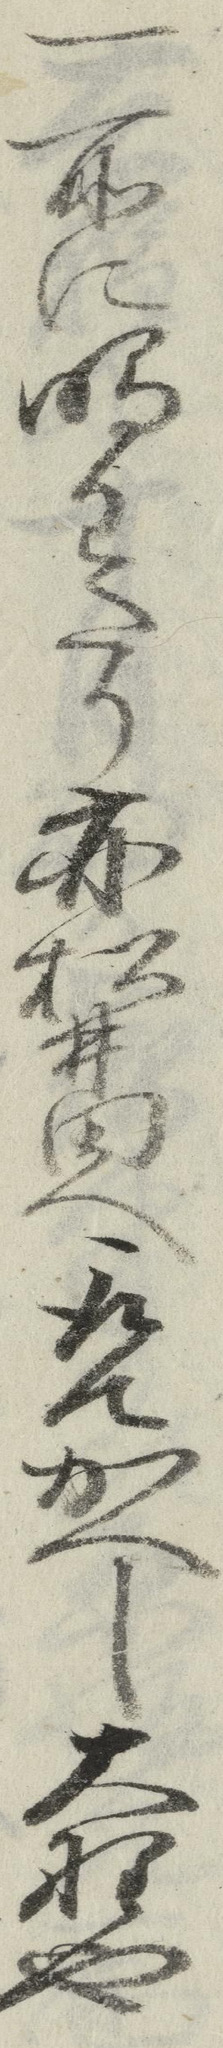一所に鳴わたり亦松井田へ取てかへし大野や
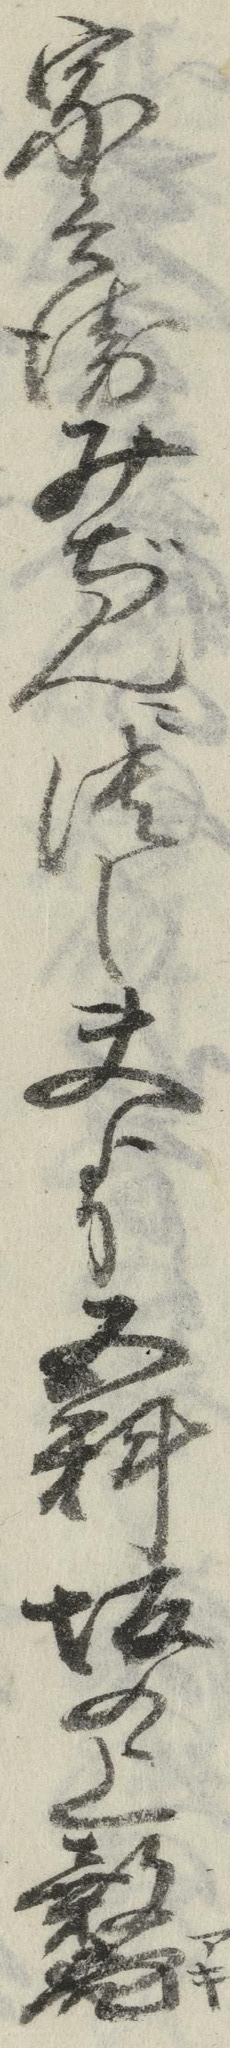宗兵衛みぢんに潰し夫より五料坂の上穀-商
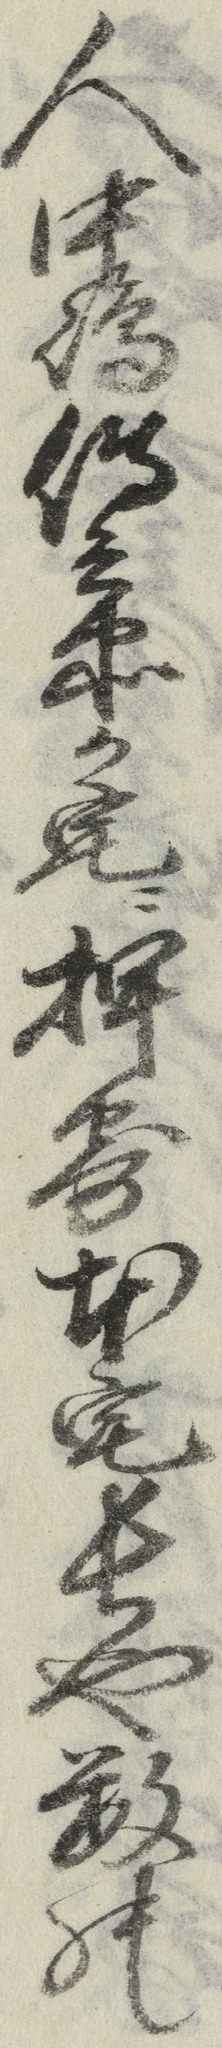人中嶋伝兵衛か宅に押寄本宅長や数の
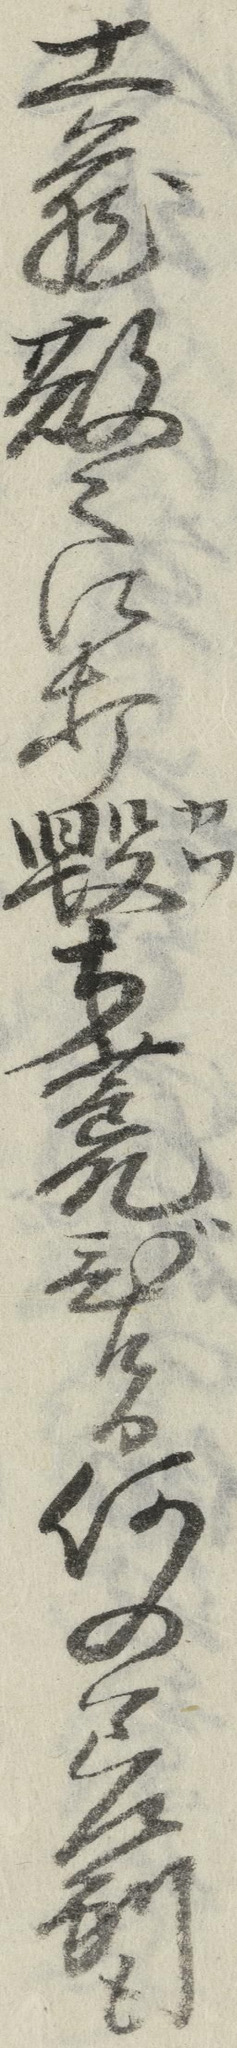土蔵散々に打毀ち荒びける何の差別も
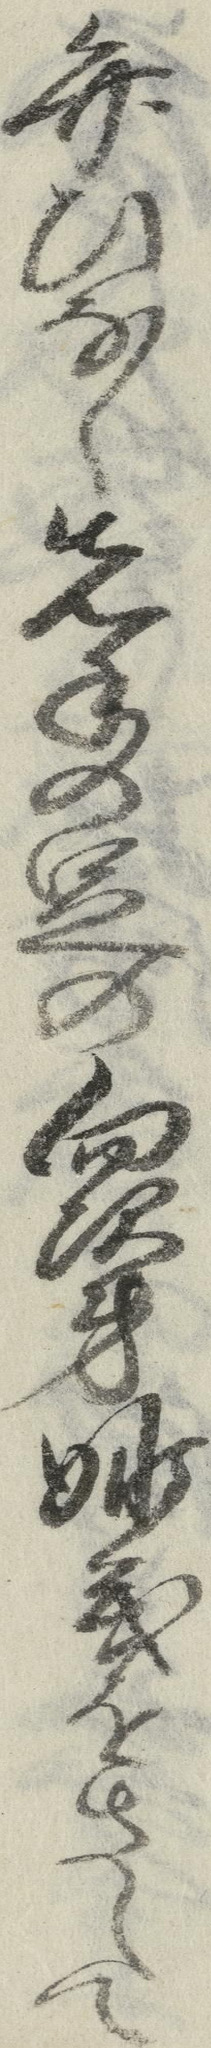弁ひなく先手の足の向次第妙義をさして
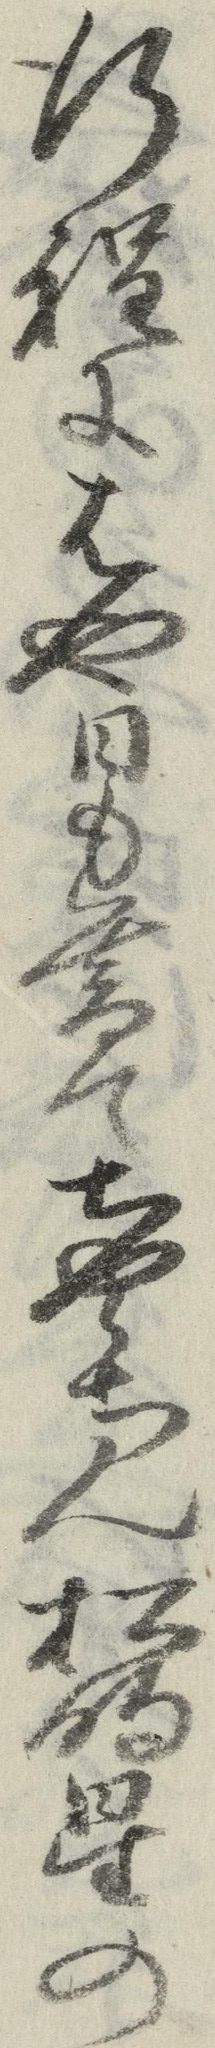行程にはや日も暮てちやうちん松鳴星の
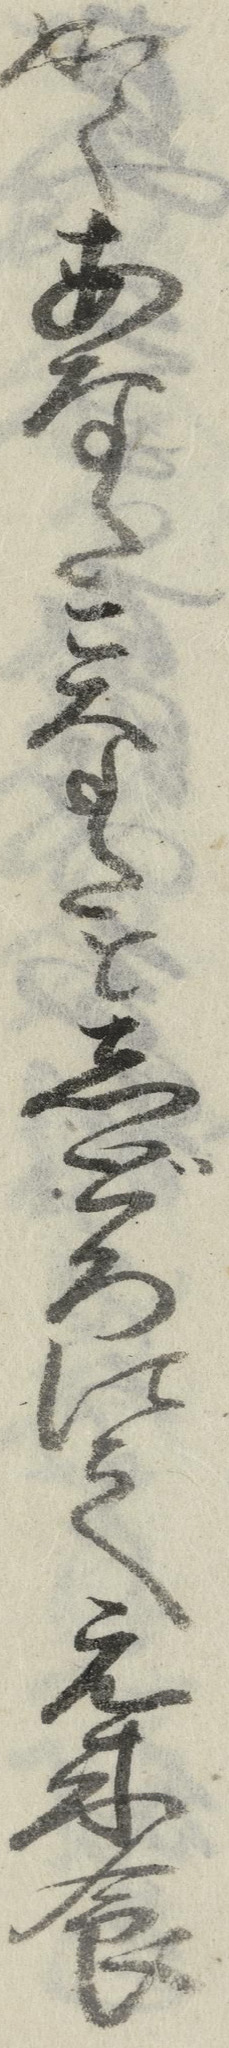如くあなたこなたとしどろにて元来食

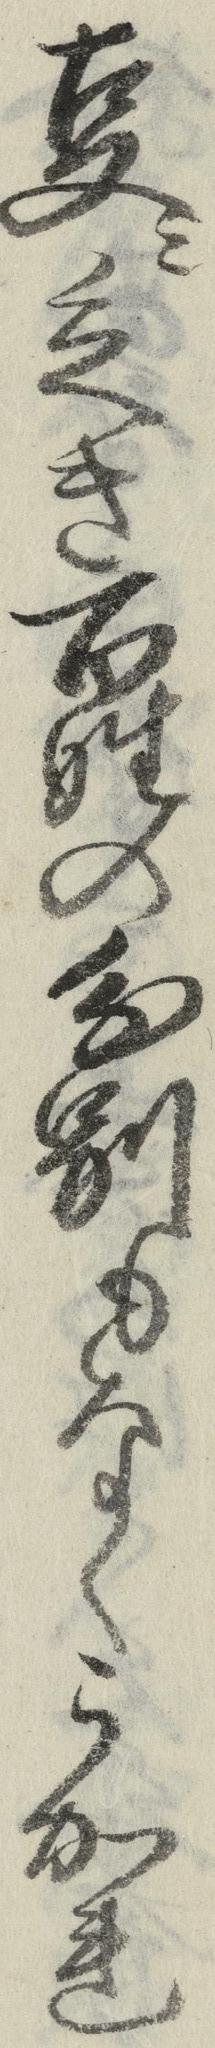事に乏き百姓の分別もなくうかれ
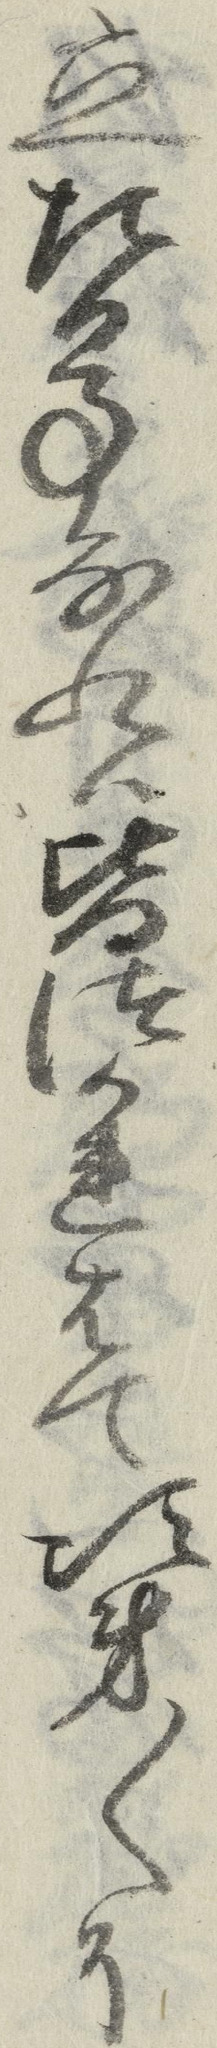立たる事なれは皆つかれはて次第〳〵に
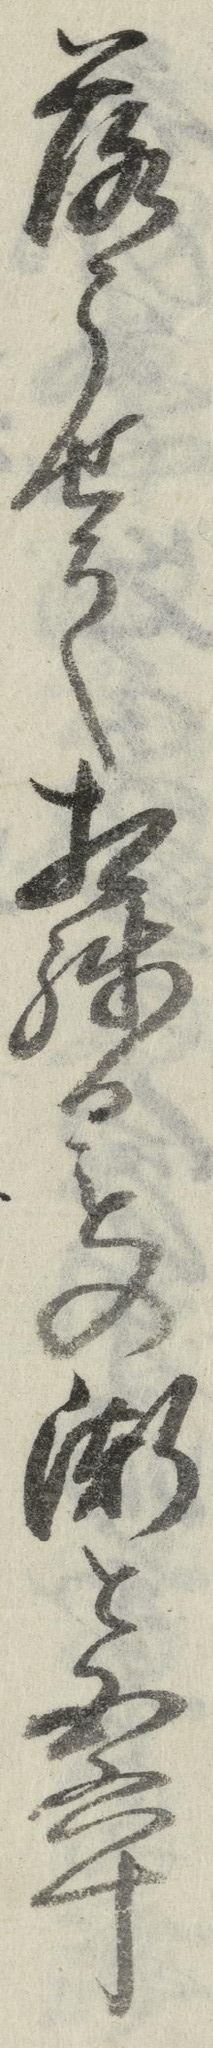落うせて相残るもの漸と五六十
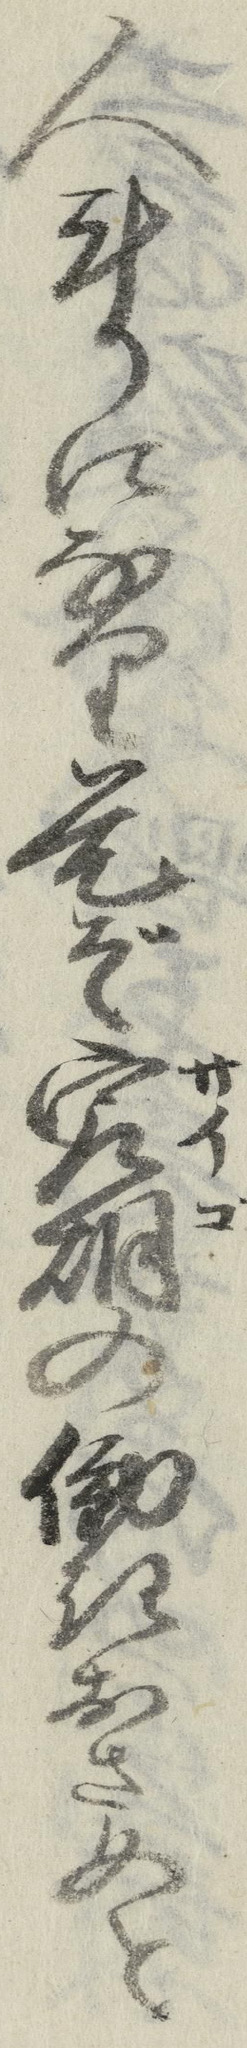人計りになり是ぞ最期の働きおさめと
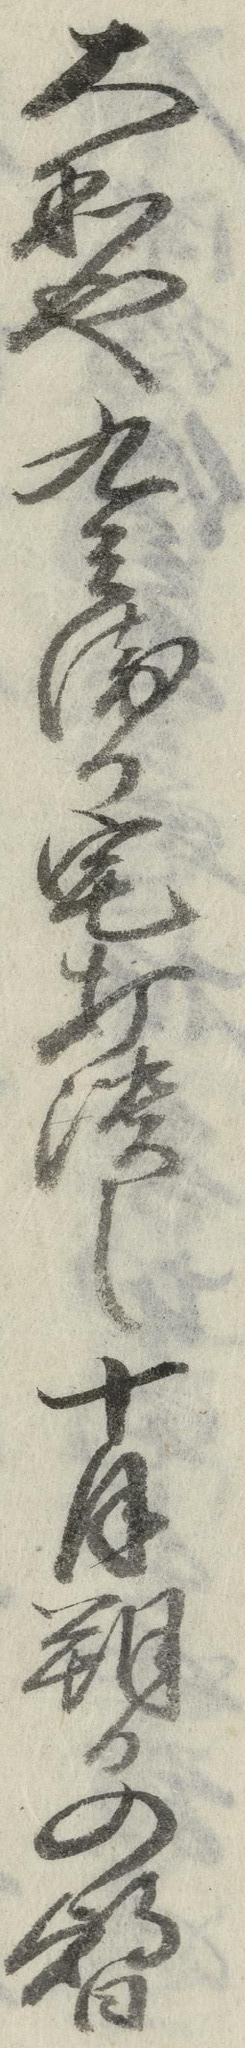大和や九兵衛か宅打潰し十月朔日の朝日
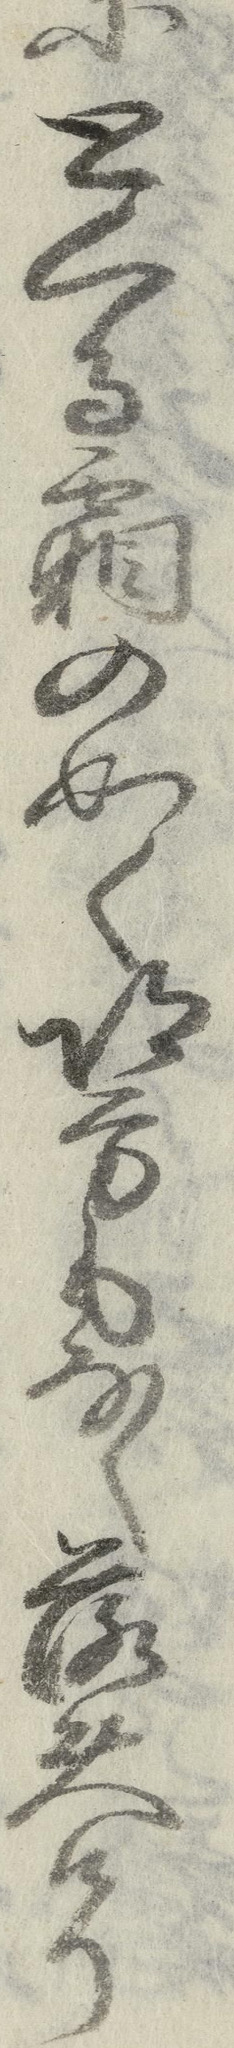にとくる霜の如く跡方もなく落失けり
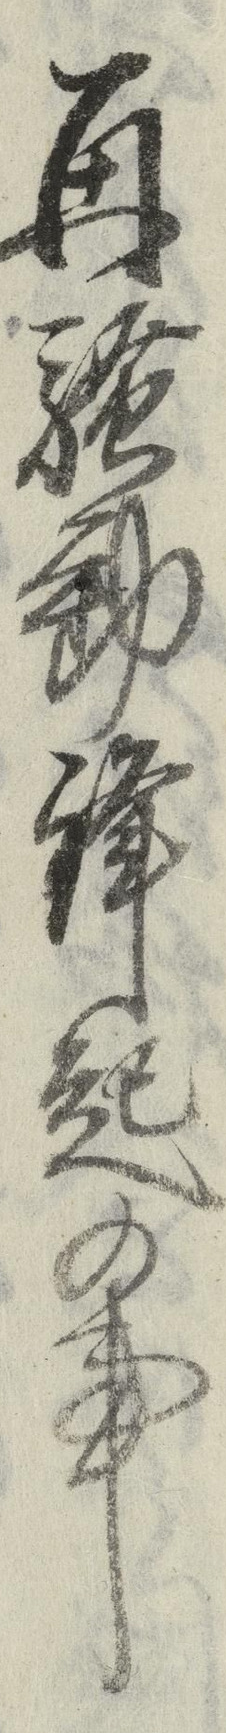再騒動鋒起の事
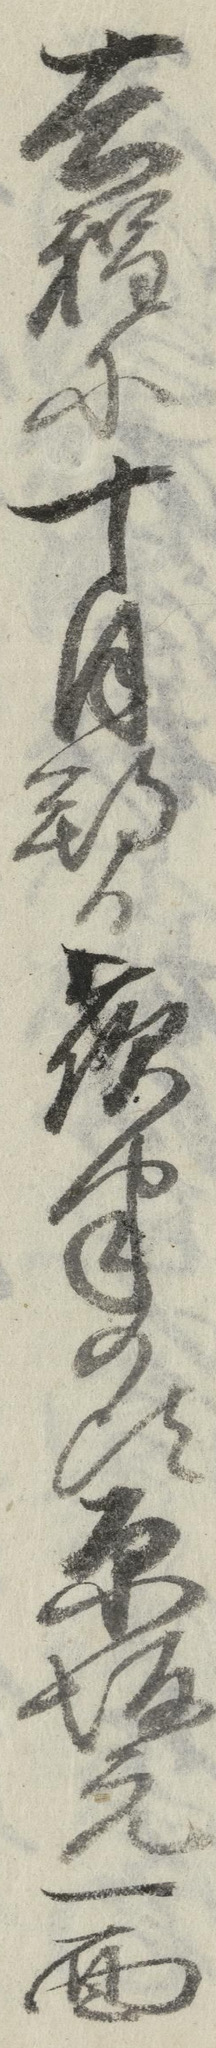去程に十月朔日夜半の頃原坂元一面
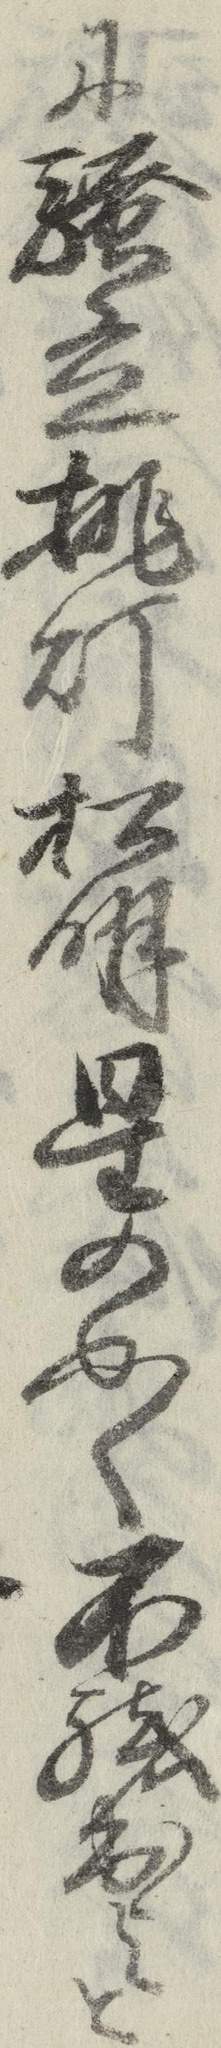に騒立挑灯松明星の如く不残出よと
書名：浅間大焼騒動記　中
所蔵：東京大学地震研究所図書室 Earthquake Research Institute Library, The University of Tokyo, JAPAN
